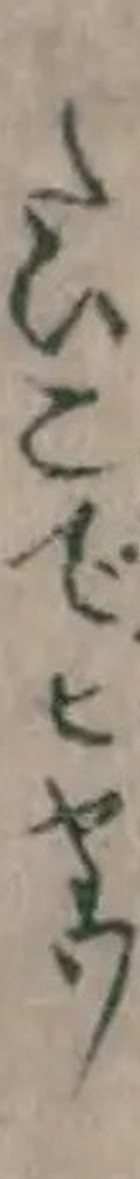たいこでヒヤウ
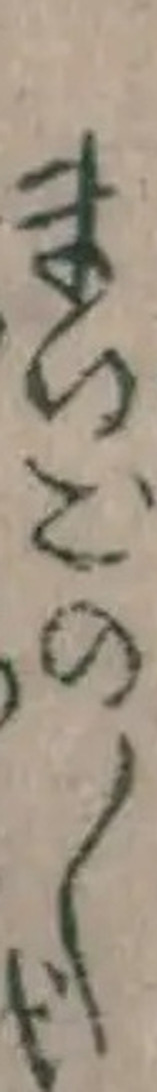まいごの〳〵
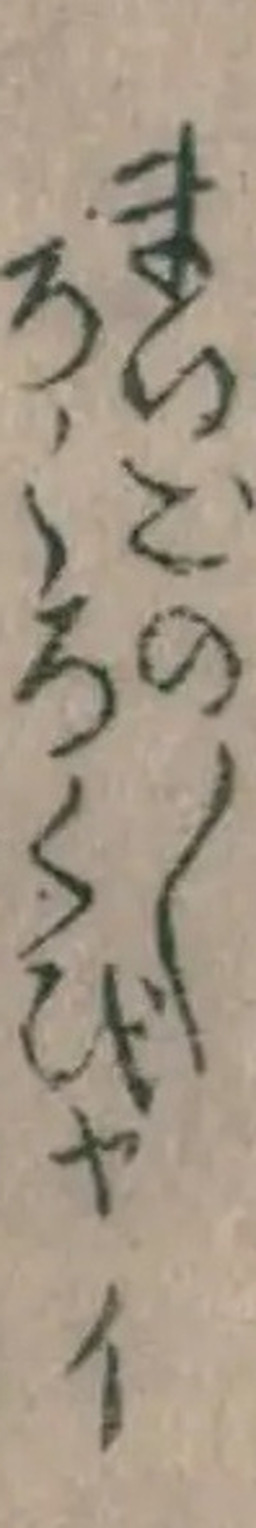ろくろくびヤイ
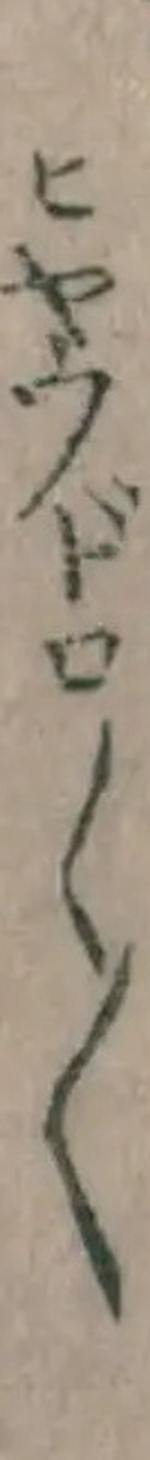ヒヤウドロ〳〵〳〵

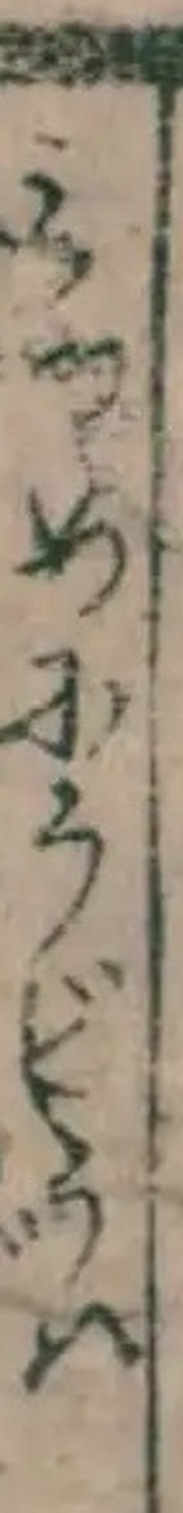みつめにうどうは
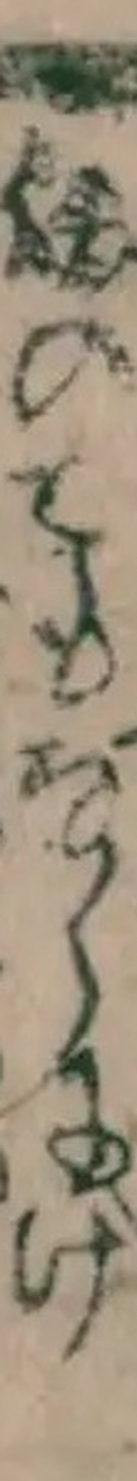何のてもなくにげ
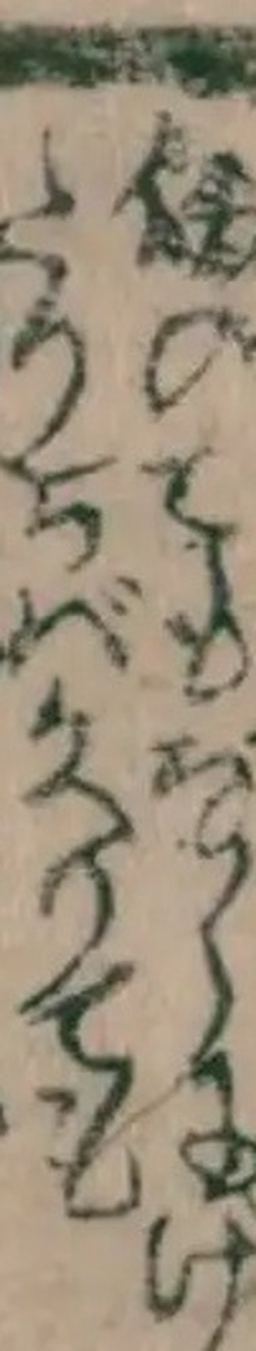たりしかばかへりても
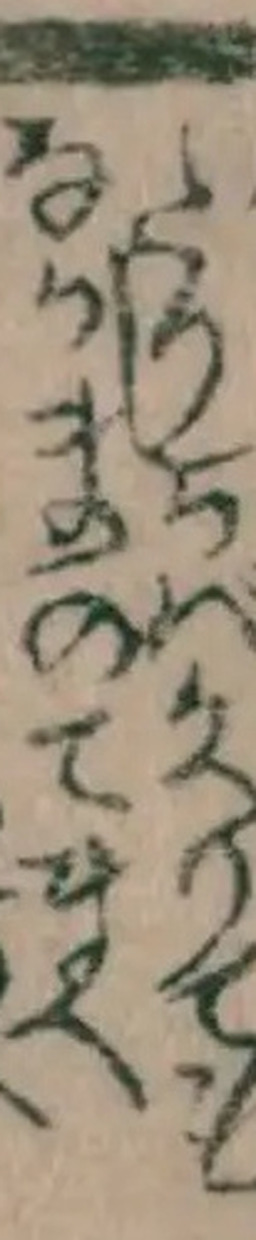なかまのてまへ
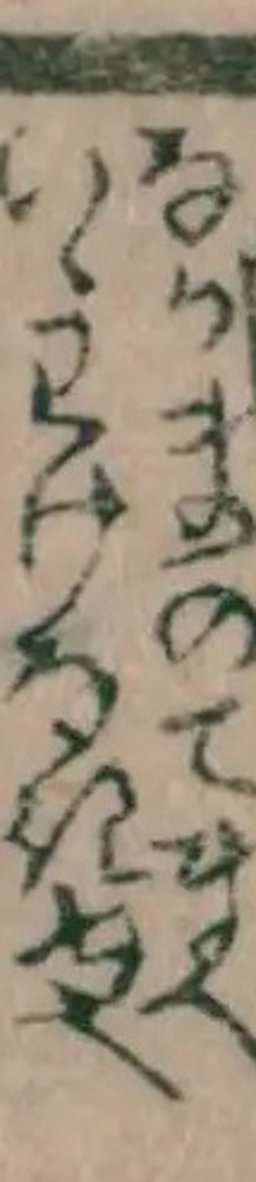いゝわけなきゆへ
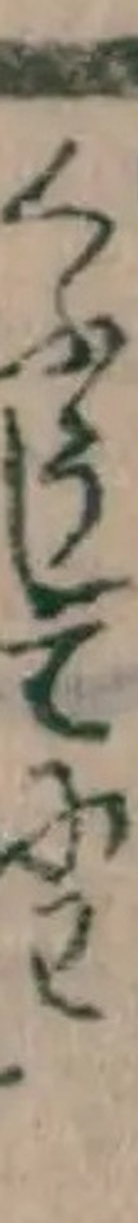くふうしてにわ
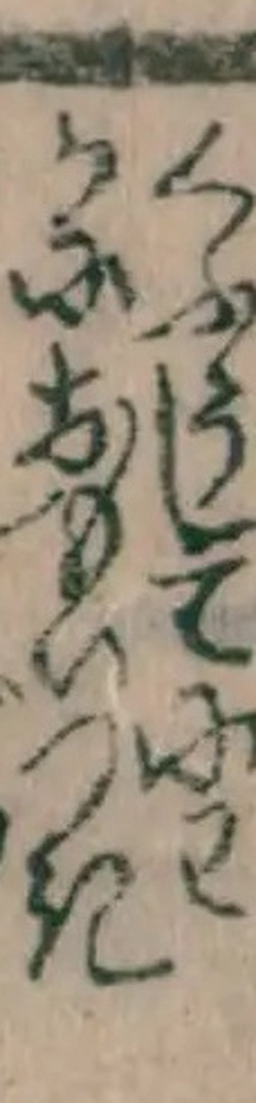かにおもいつき
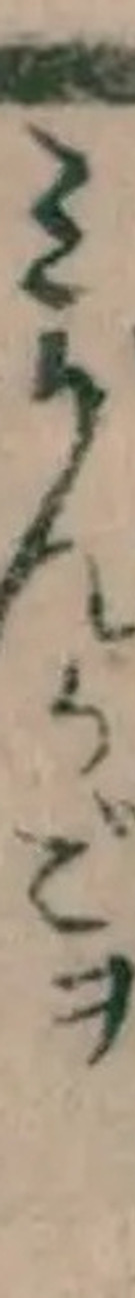みかんかごを
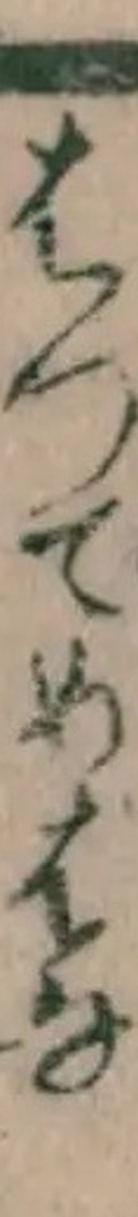はつてめはな
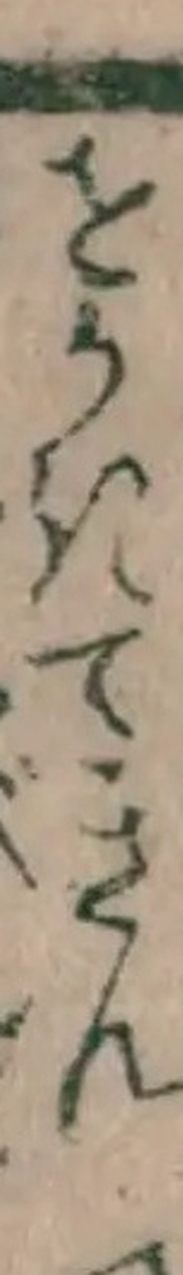をかきてきん
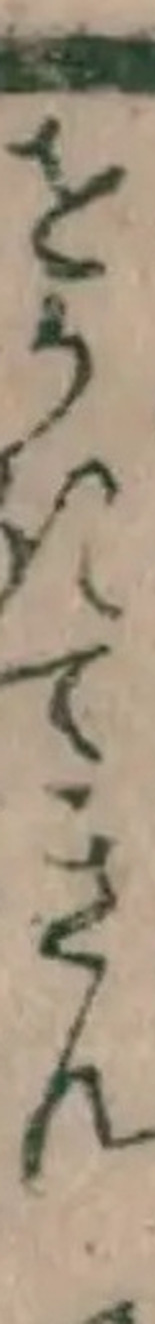をかきてきん
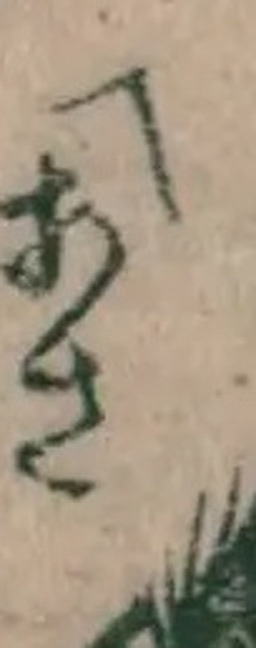〽あさ
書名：信有奇怪会
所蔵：国立国会図書館 National Diet Library, JAPAN
